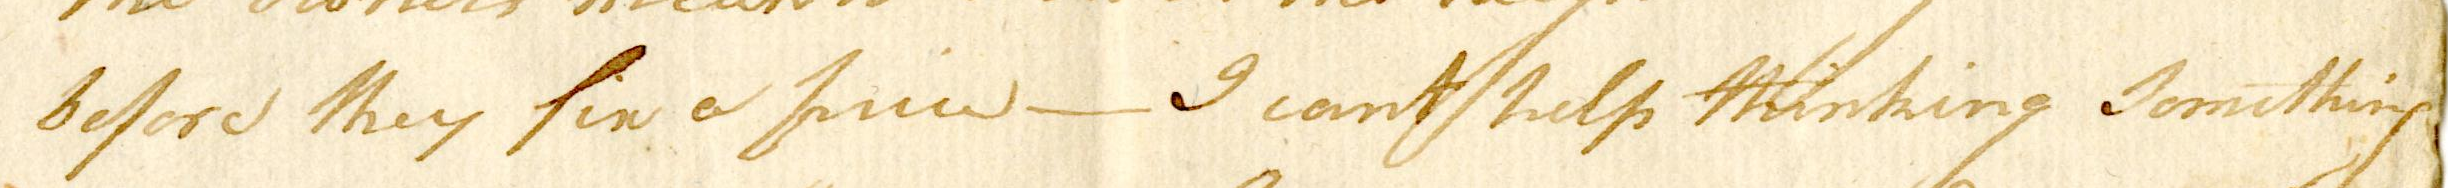before they fin a price- I cant help thinking something
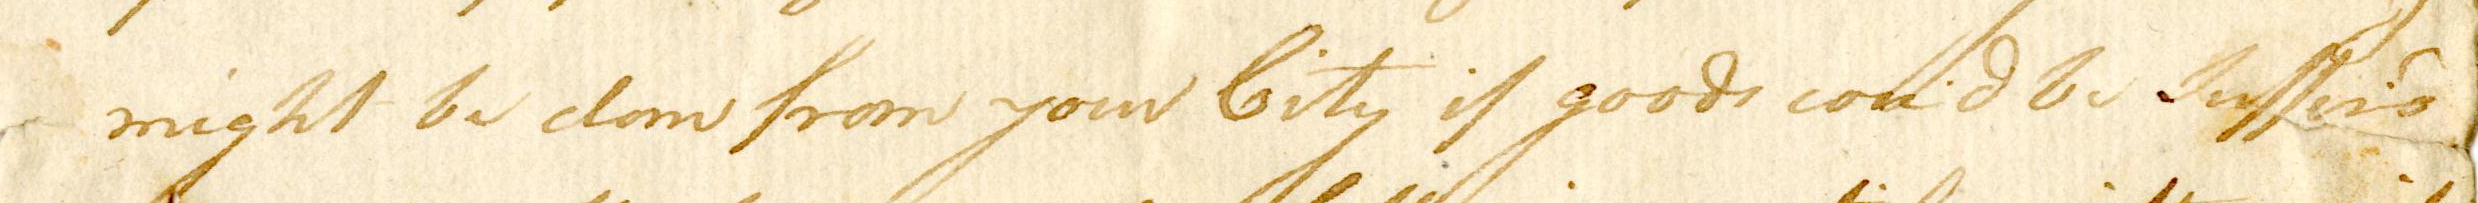might be down from your City if goods cou'd be suffer'd
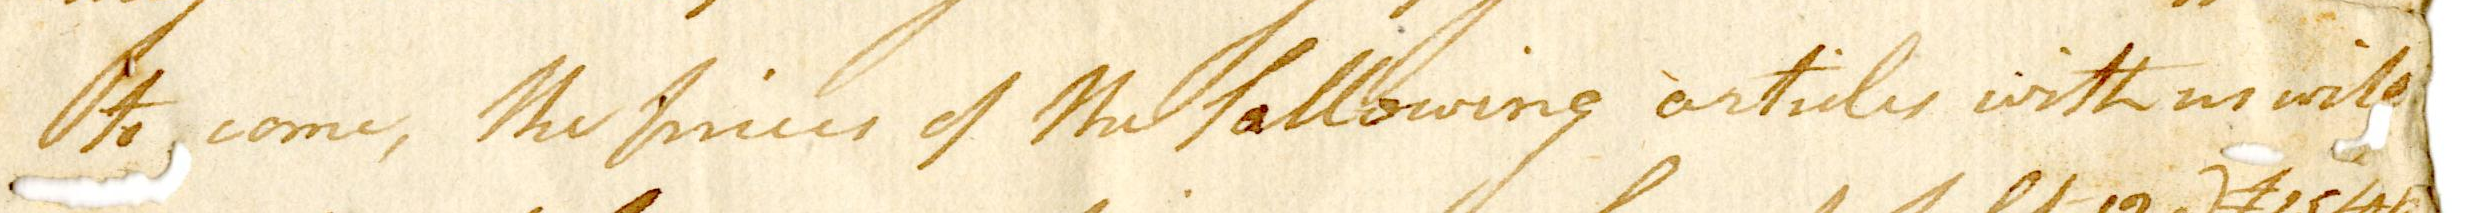to come, the prices of the following articles with us will
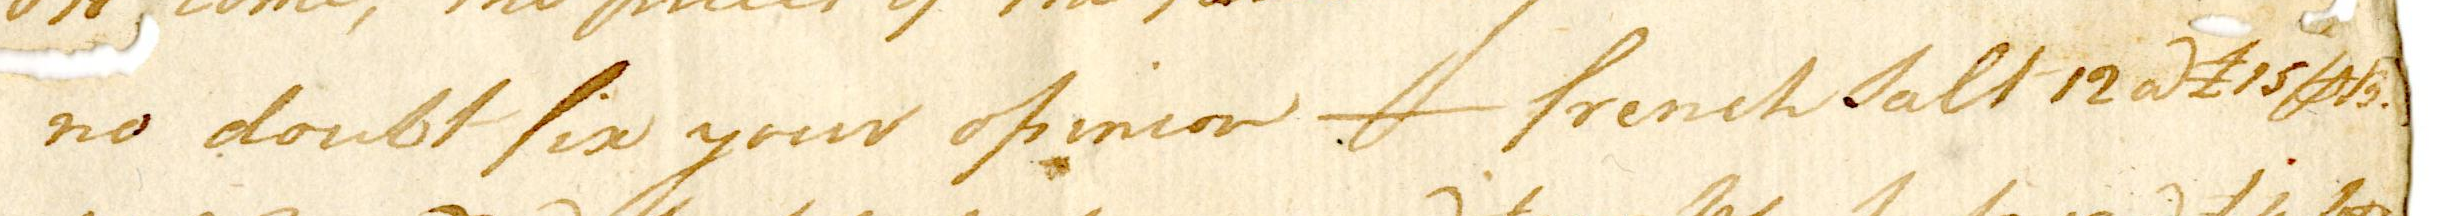no doubt fix your opinion- french Salt 12 @ £15 per lb.
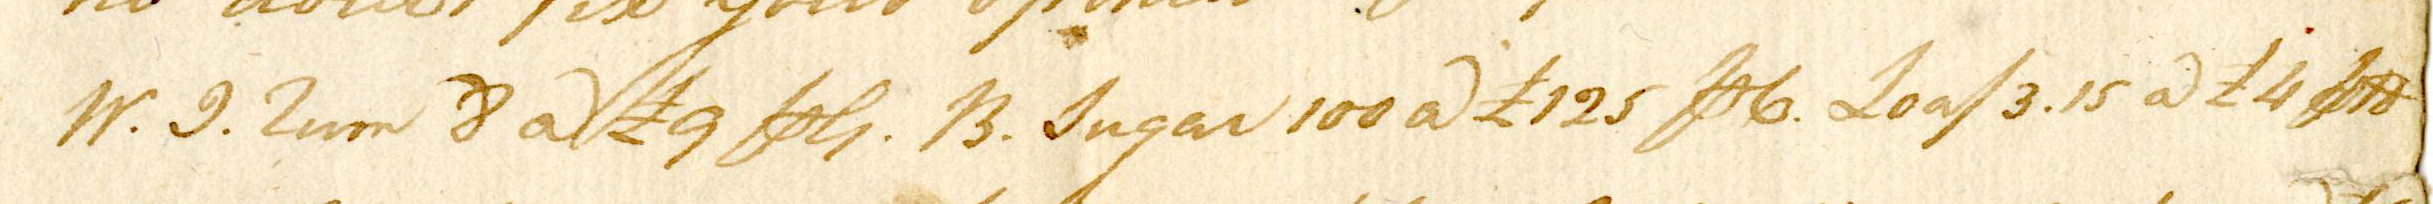W. L. rum 8 @ £9 per. B. Sugar 100 @ £125 per 6 Loaf 3.15 @ £4 per
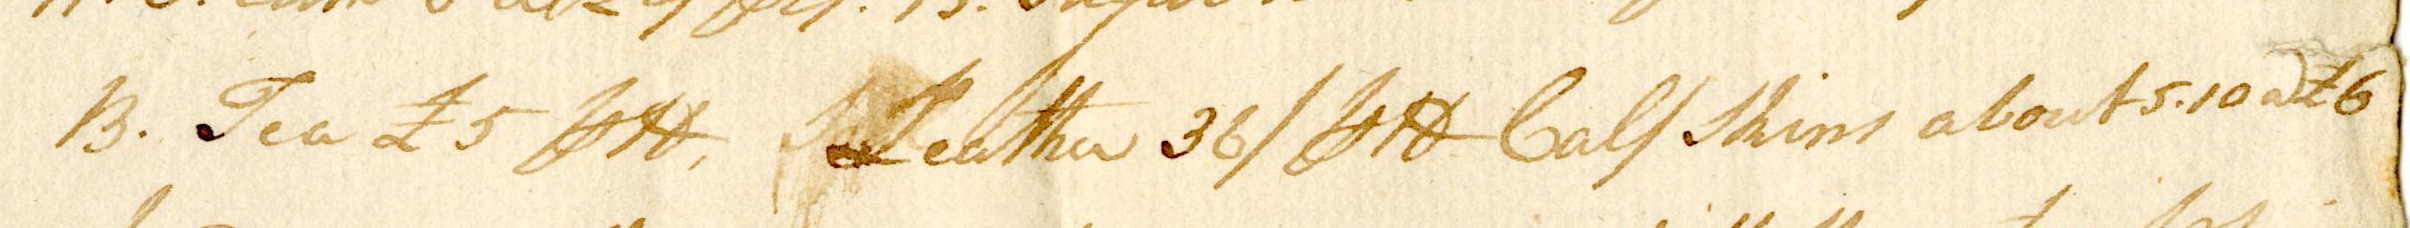B. Tea £5 per lb. Leather 36s per lb Calf Shins about 5.10 @ £6
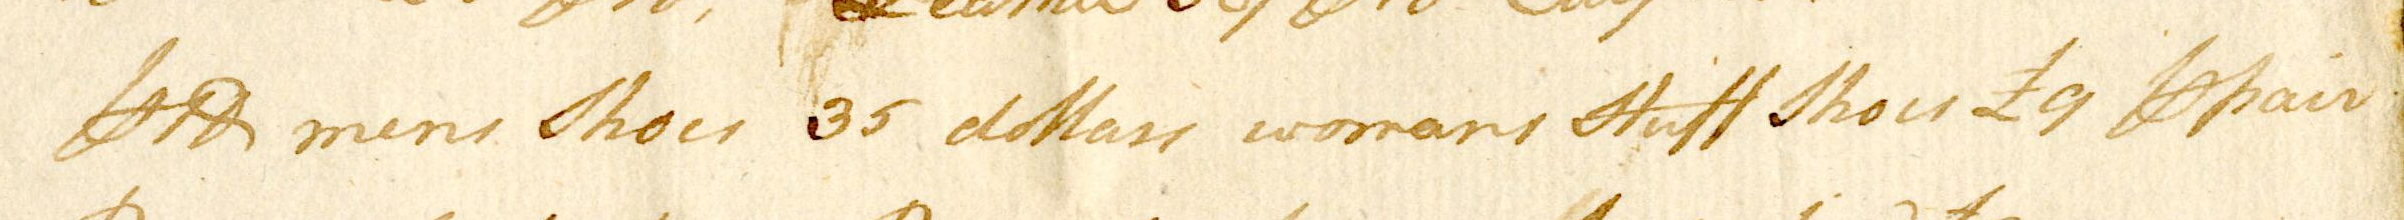per lb mens Shoes 35 dollars womans stiff shoes £9 per pair
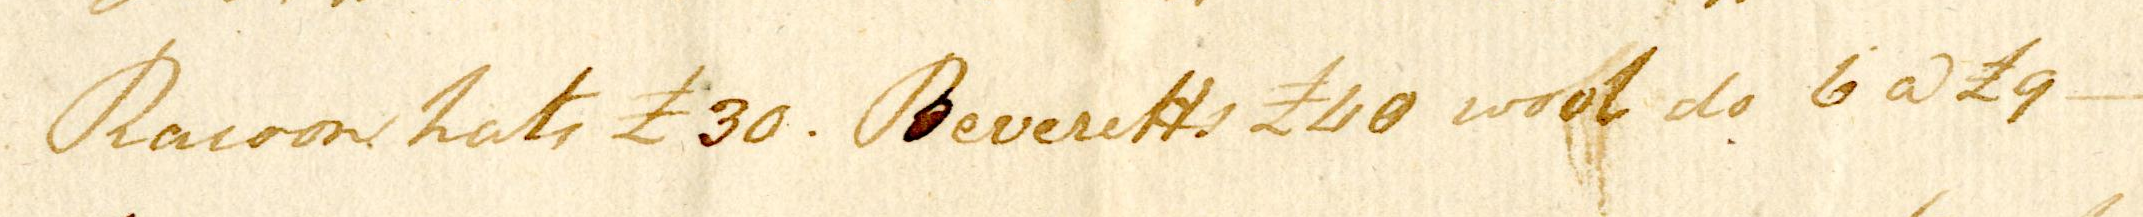racoon hats £30. Beveres £40 wool do 6 @ £9-
